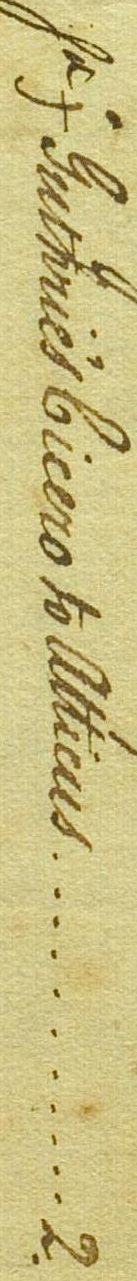Guthrie's Cicero to Atticus. ..........2.
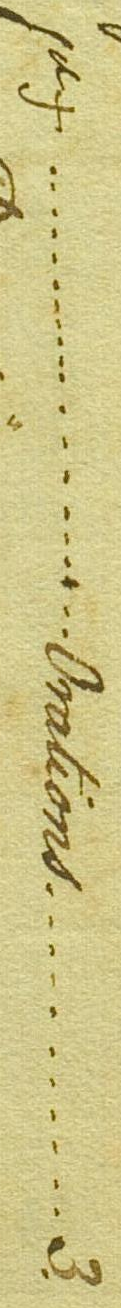................ Orations. ..........3.
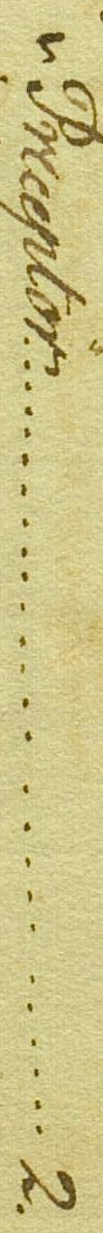- Preceptor........2.
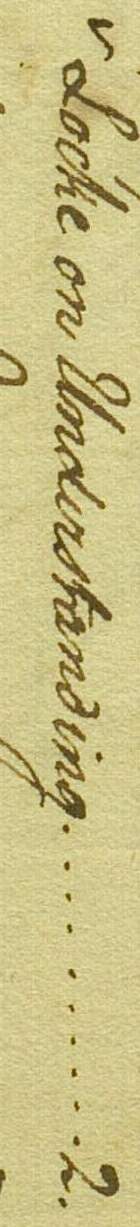- Locke on Understanding........... 2.
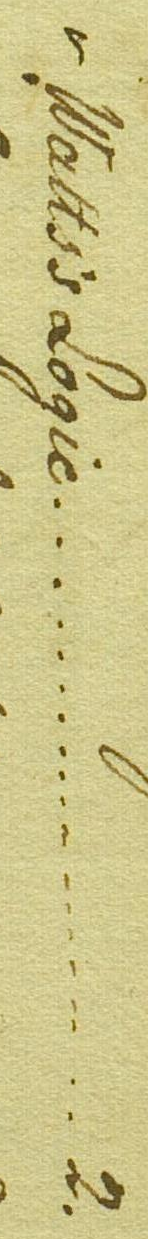- Watts's Logic. .................. 2.
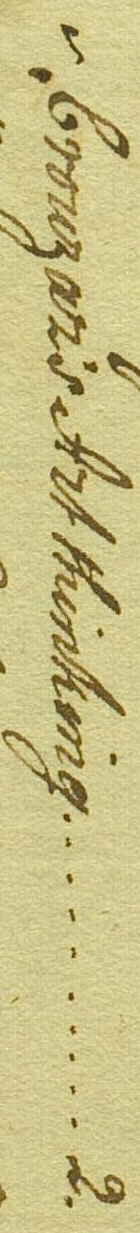- Crouzar's Art thinking........... 2.
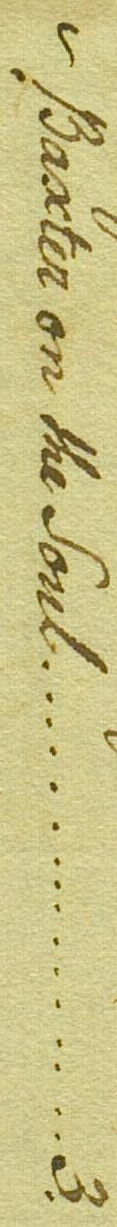- Baxter on the Soul................3.
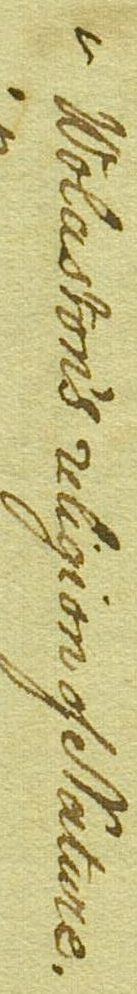- Wolaston's religion of Nature.
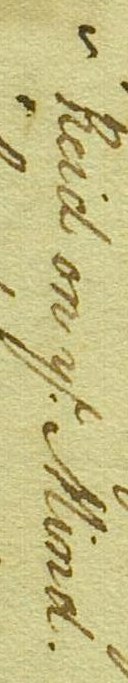- Reid on y^e. Mind.
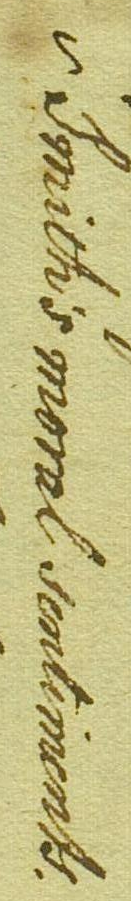- Smith's moral sentiments.
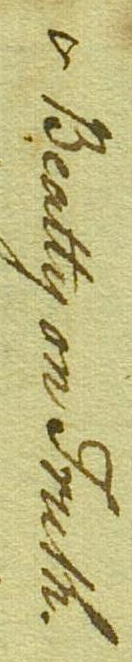- Beatty on Truth.
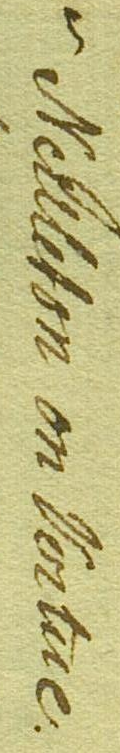- Nettleton on Virtue.
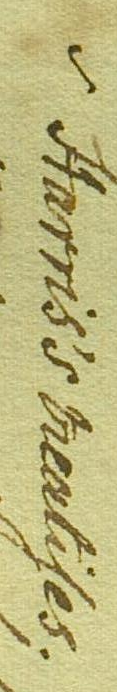- Harris's treatises.
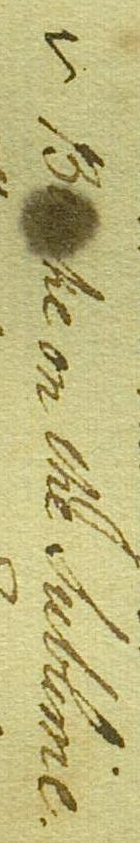- Burke on the Sublime.
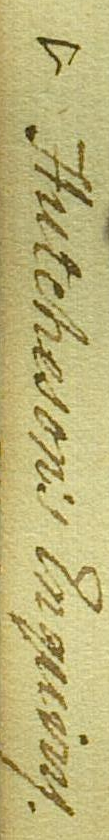- Hutcheson's Enquiry.
